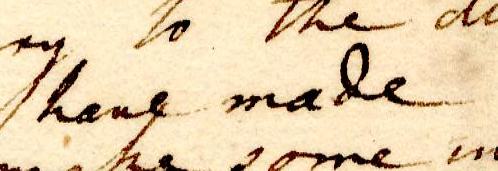have made
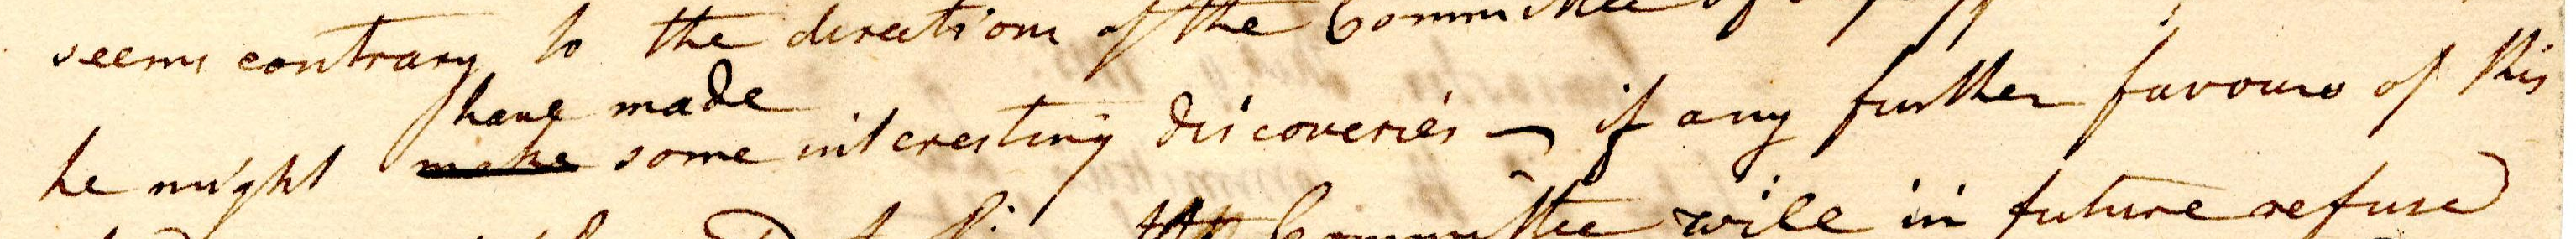he might [make] some interesting discoveries, if any further favours of this
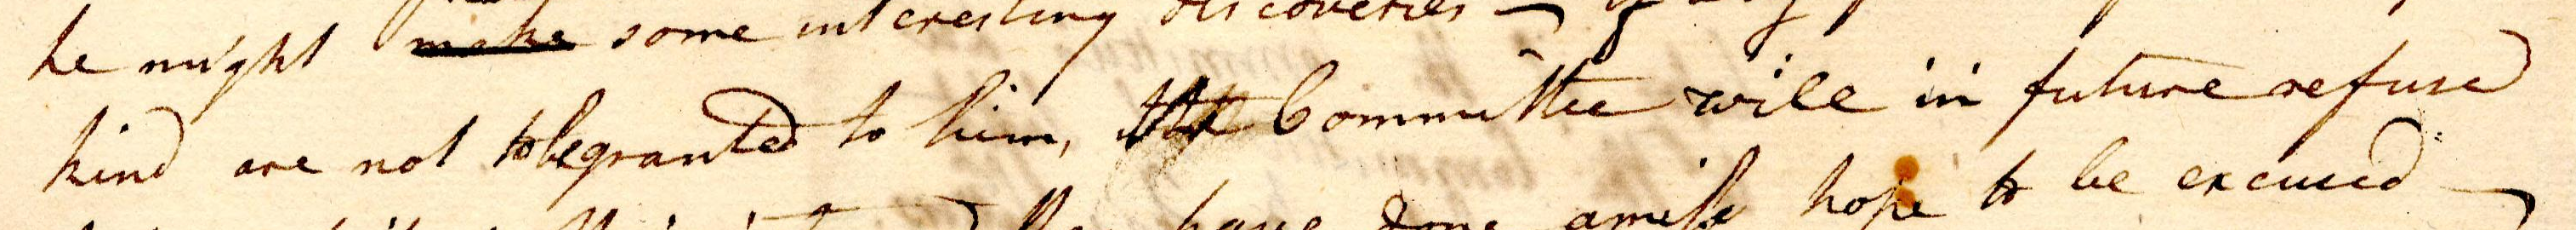kind are not to be granted to him, the Committee will in future refuse
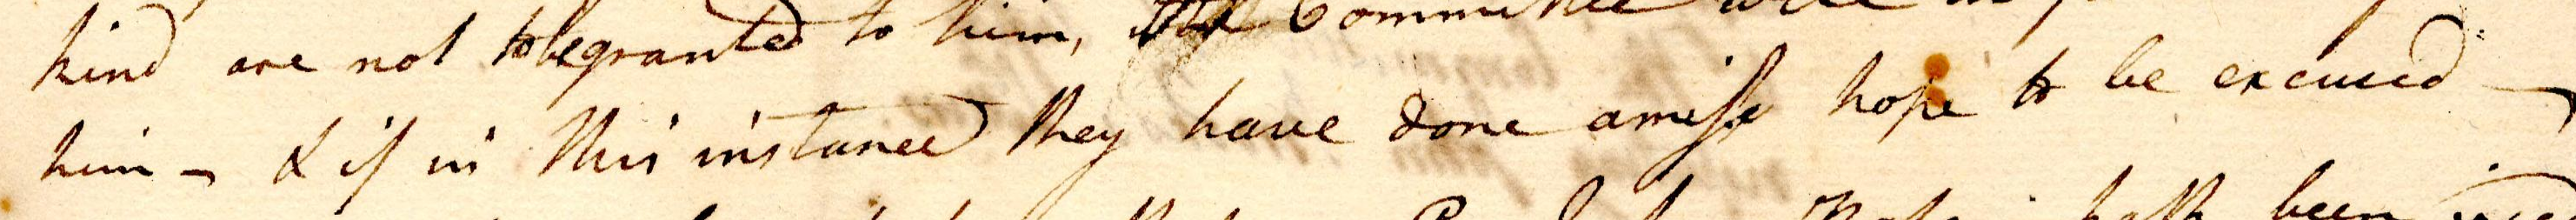him, & if in this instance they have done amiss hope to be excused.
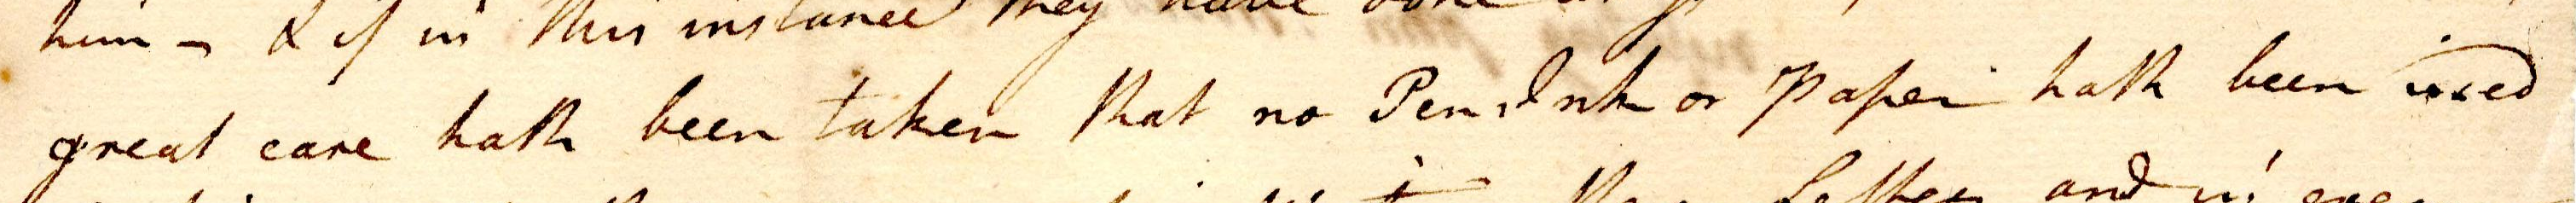great care hath been taken that no Pen, Ink or paper hath been used
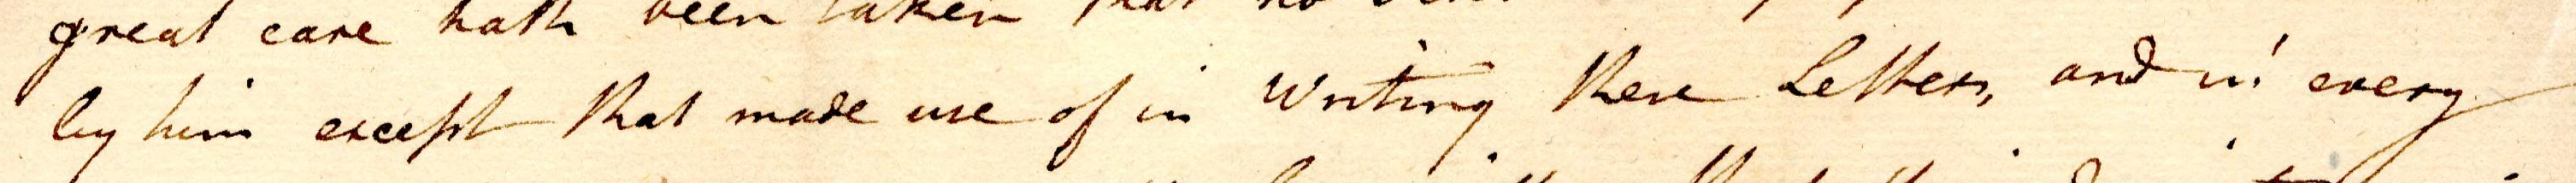by him except that made use of in Writing these letters, and in every
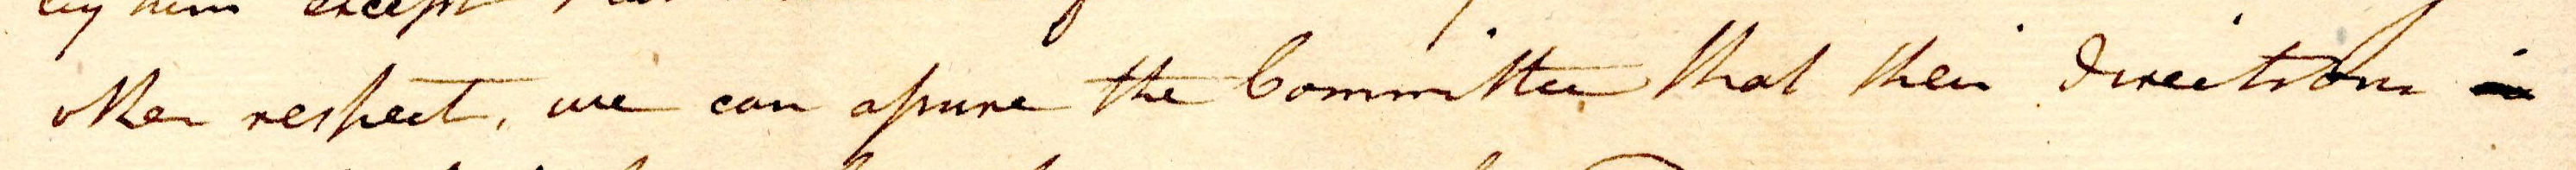other respect, we can assure the Committee that then Directions [in]
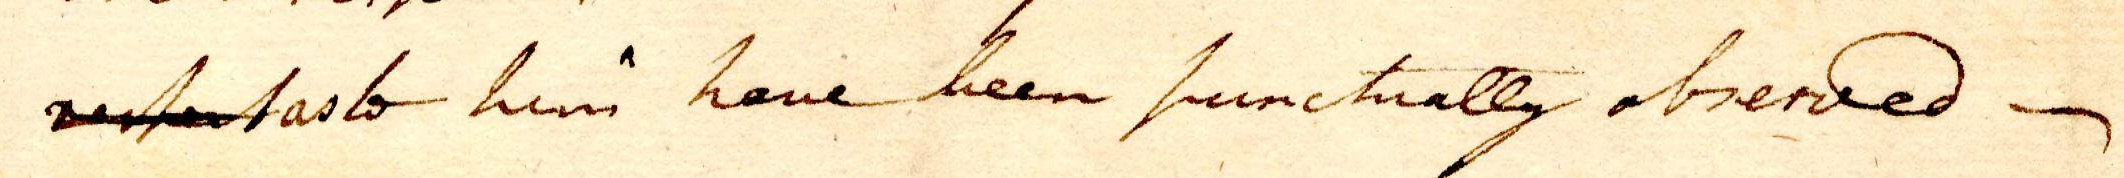[respect] ask to him have been punctually observed-
